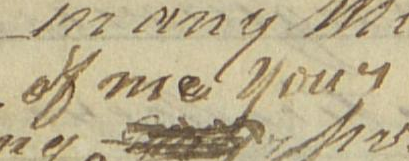of me your
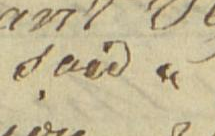said a
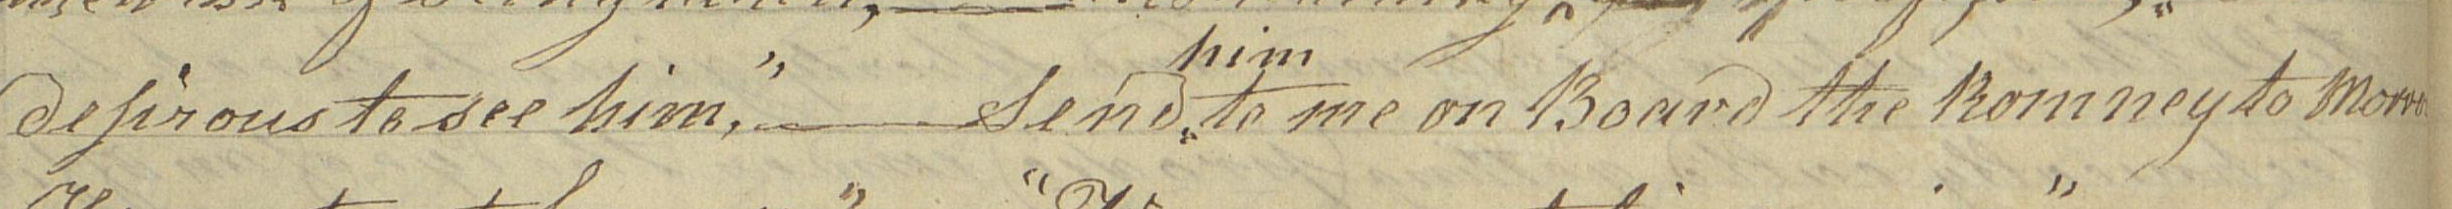desirous to see him," send ^ to me on Board the Romney to Morr-
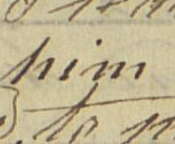him
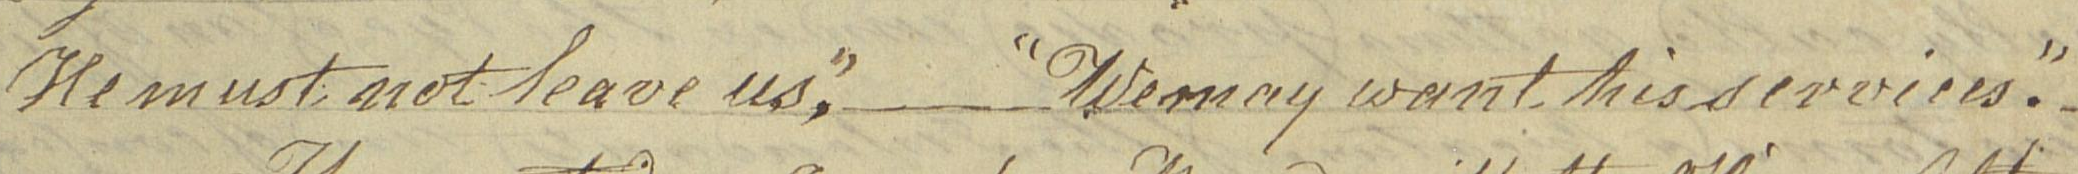He must not leave us." "We may want his services."
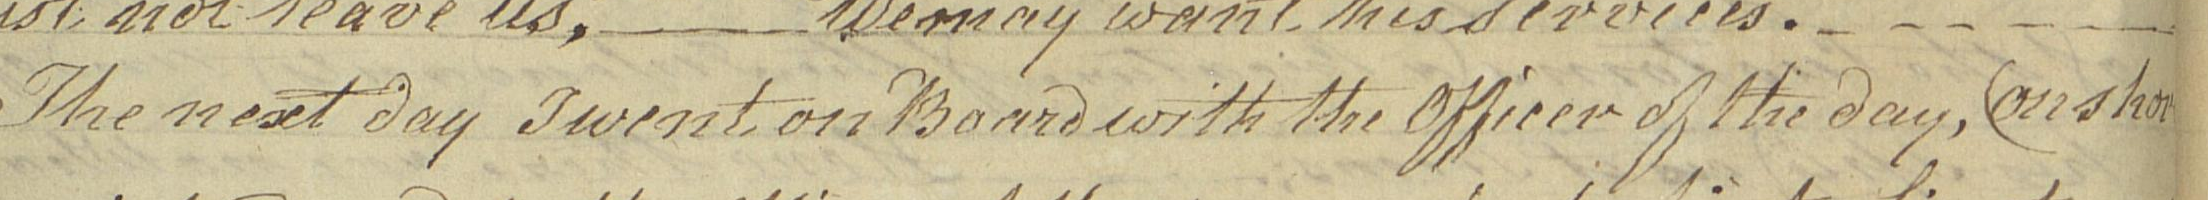The next day I went or Board with the Officer of the day, (on shov-
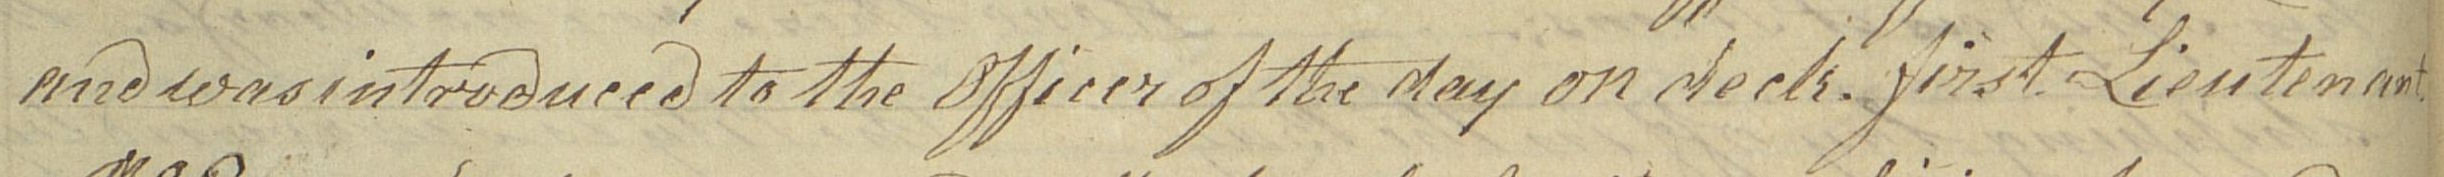and was introduced to the Officer of the day on deck. first Lieutenant
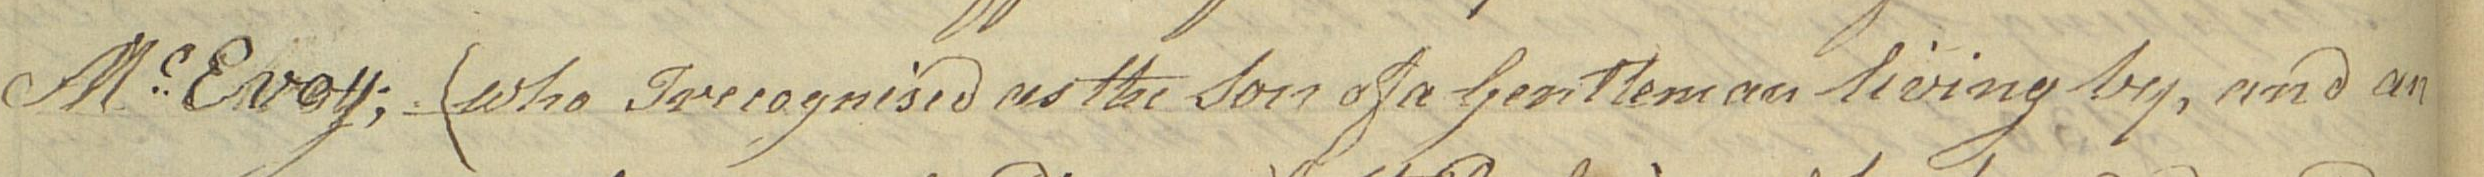M^c.Evoy; (who I recognised as the Son of a Gentleman Living by, and an
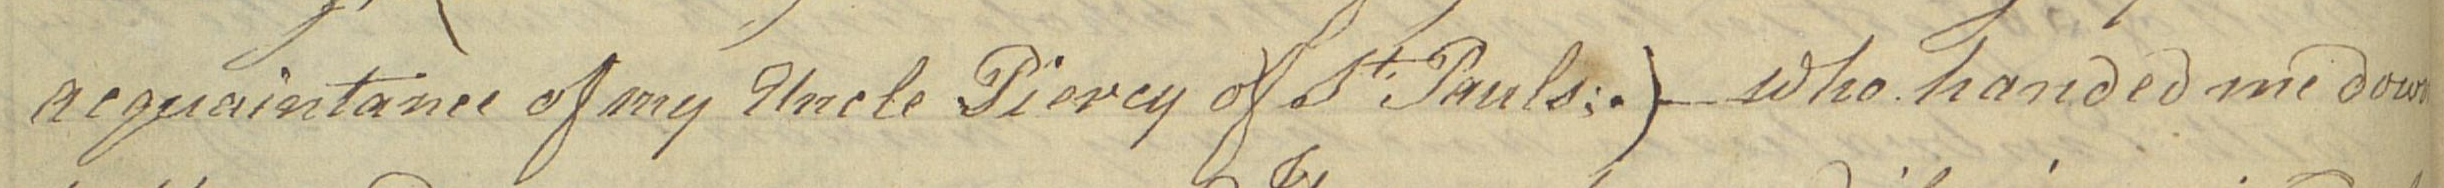acquaintance of my Uncle Piercy of S^t. Pauls:) who handed me down
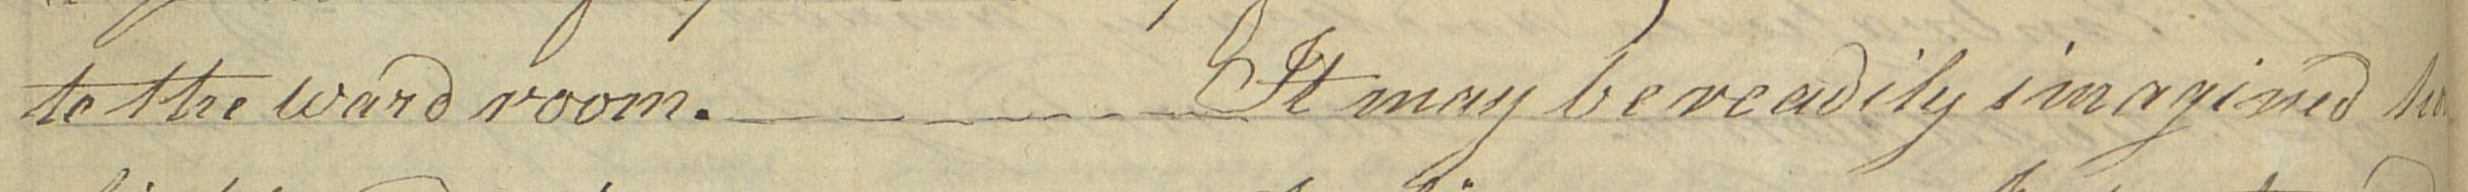to the ward room. It may be readily imagined h-
